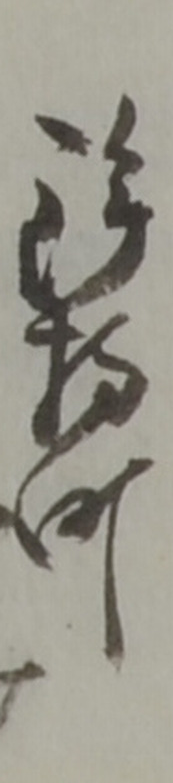鉾持町
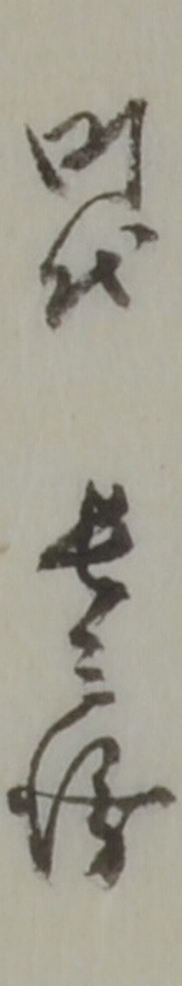町代長兵衛
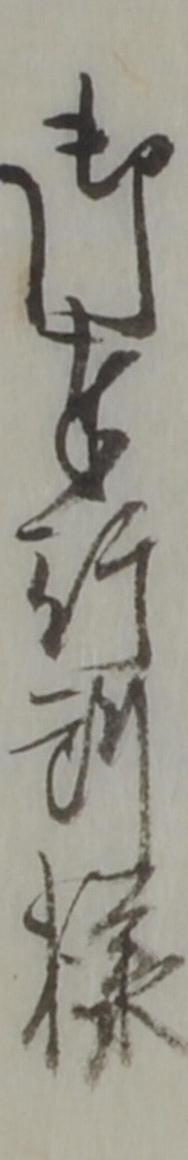御奉行所様
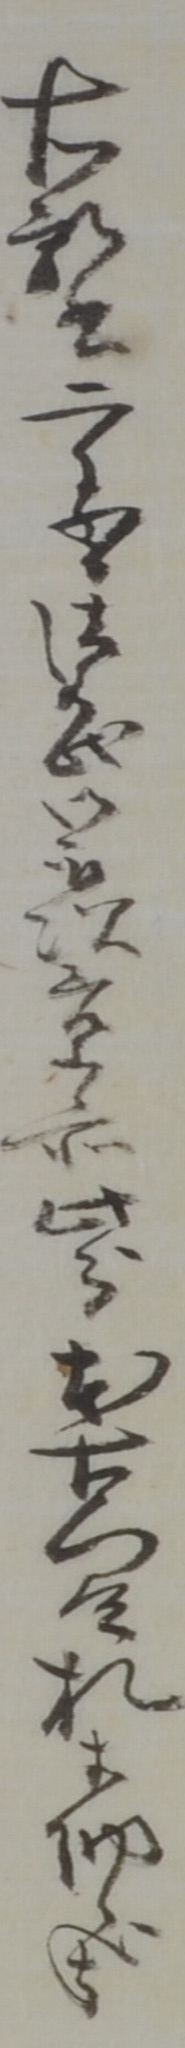右願書二月五日清水氏御取次差上候所此分本右衛門殿札相納候哉
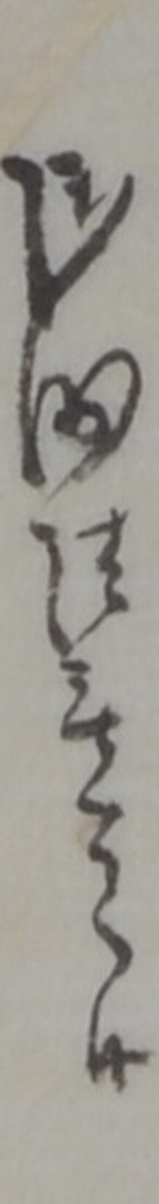御沙汰無之候
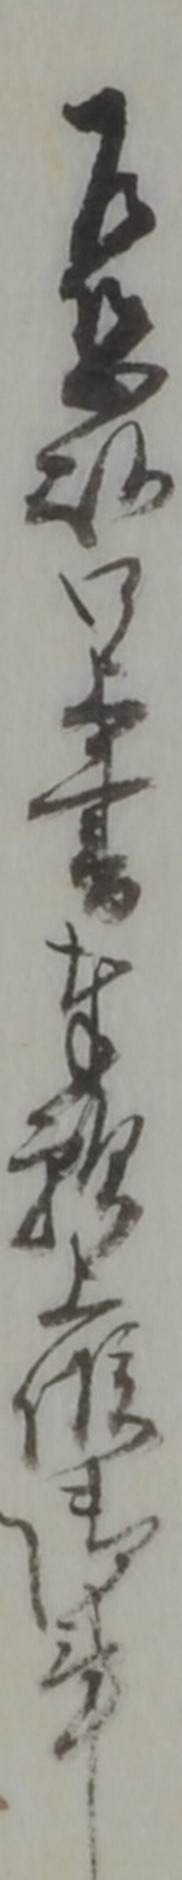乍恐以口上書奉願上候御事
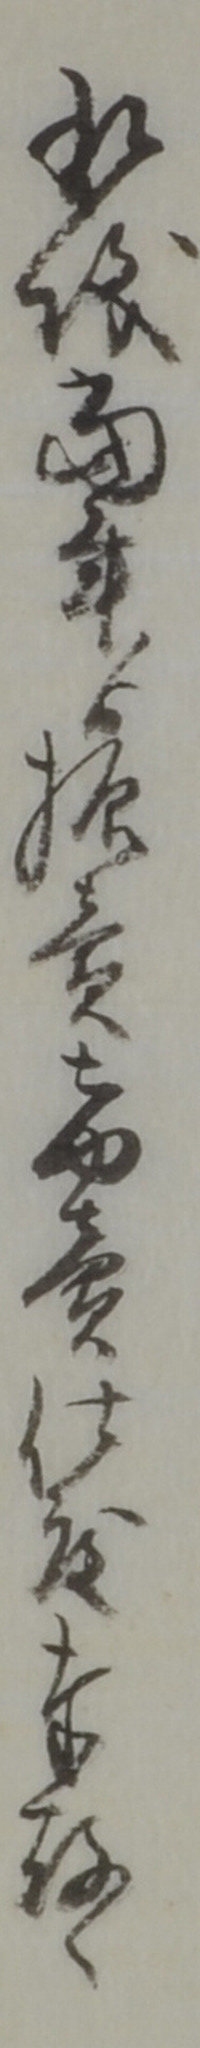私儀当年ゟ振売商売仕度奉存候
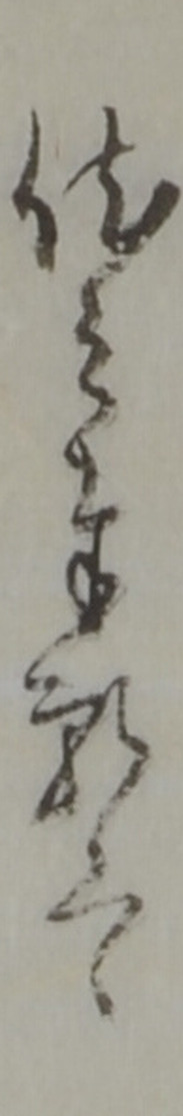依之奉願上候
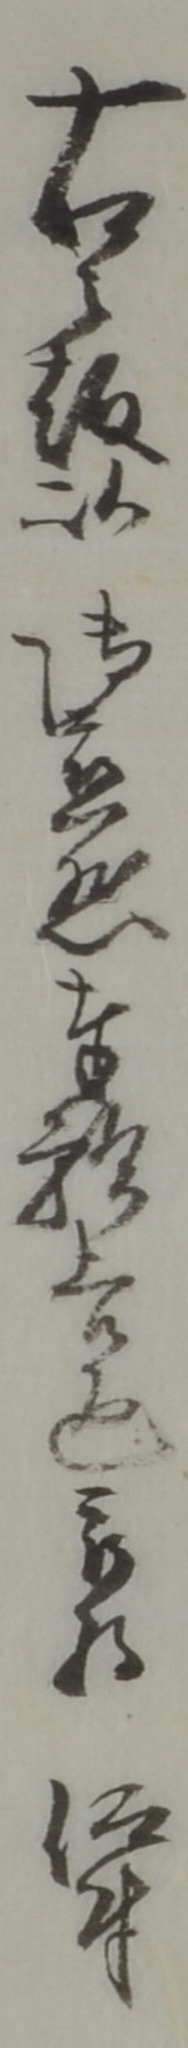右之趣以御慈悲奉願上候通被為仰付
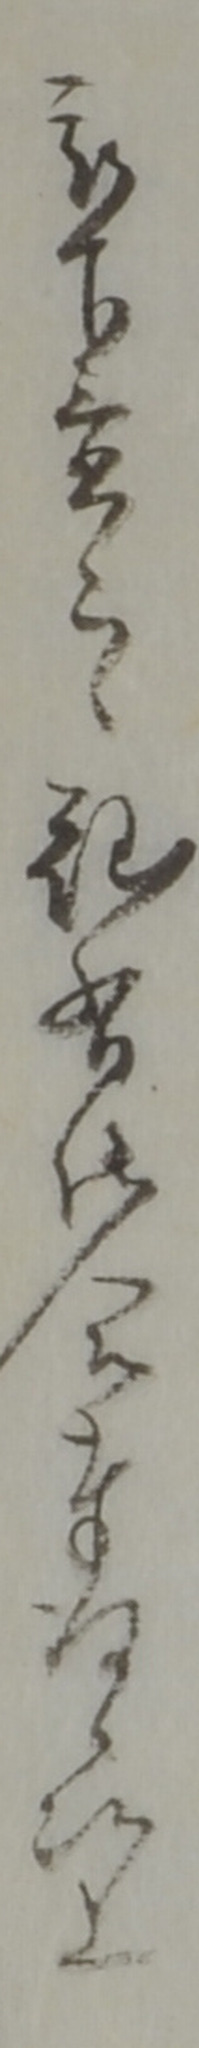被下置候ハヽ難有仕合奉存候以上
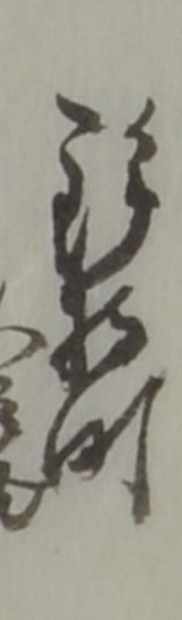鉾持町
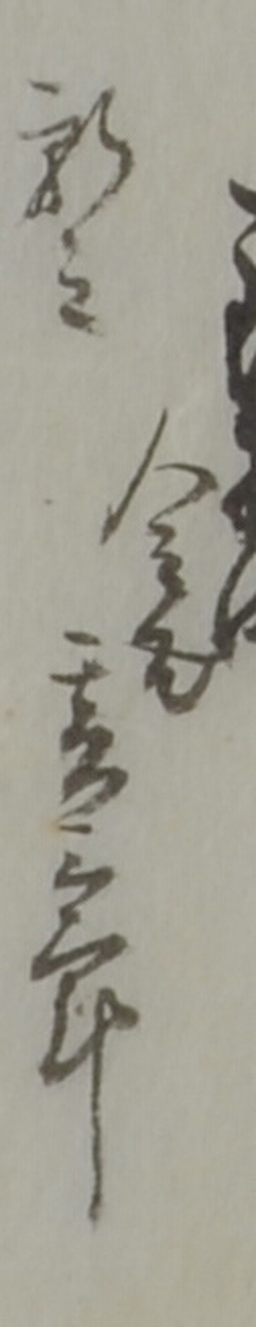願主亥三郎
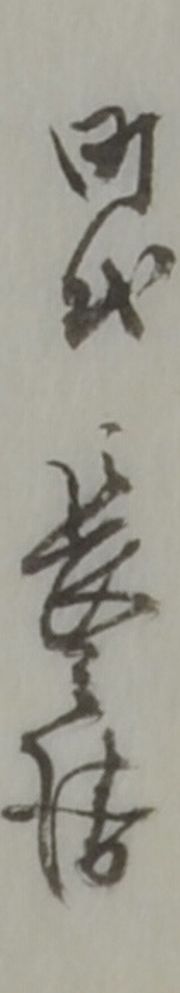町代長兵衛
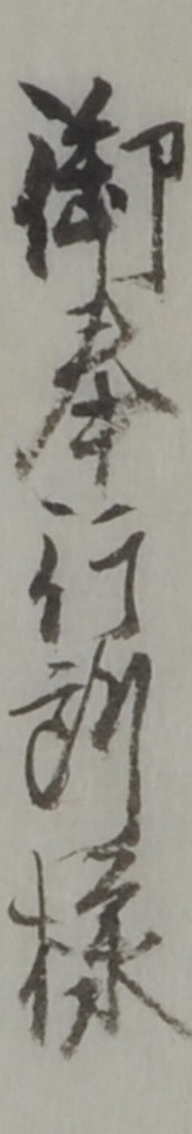御奉行所様
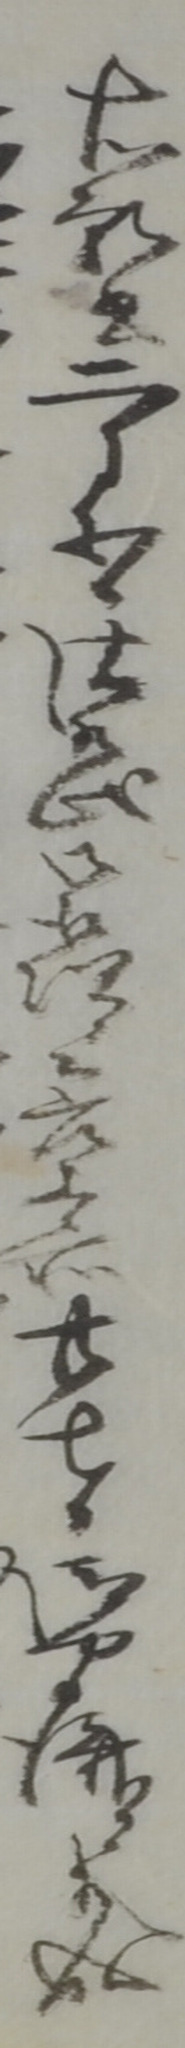右願書二月五日清水氏御取次二而差上候所廿七日御聞済ニ相成
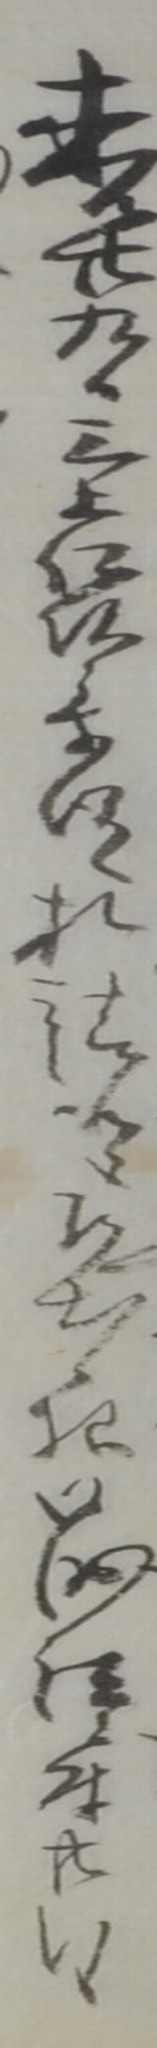来ル廿九日三上仁次兵衛様へ札請取ニ罷出候様御沙汰ニ付廿八日
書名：諸願書控簿
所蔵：伊那市立高遠町図書館・合同会社AMANE
